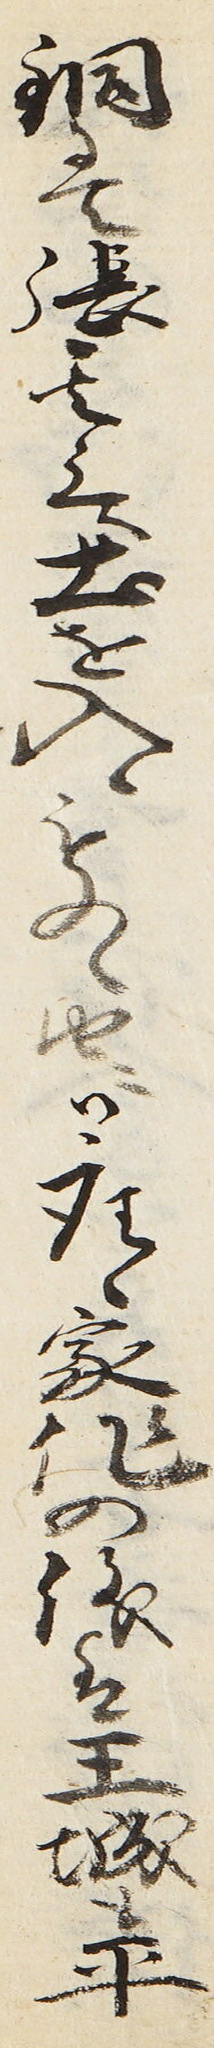銅にて張其上へ土を入候ものゝ由に御座候家作の儀は王城も平
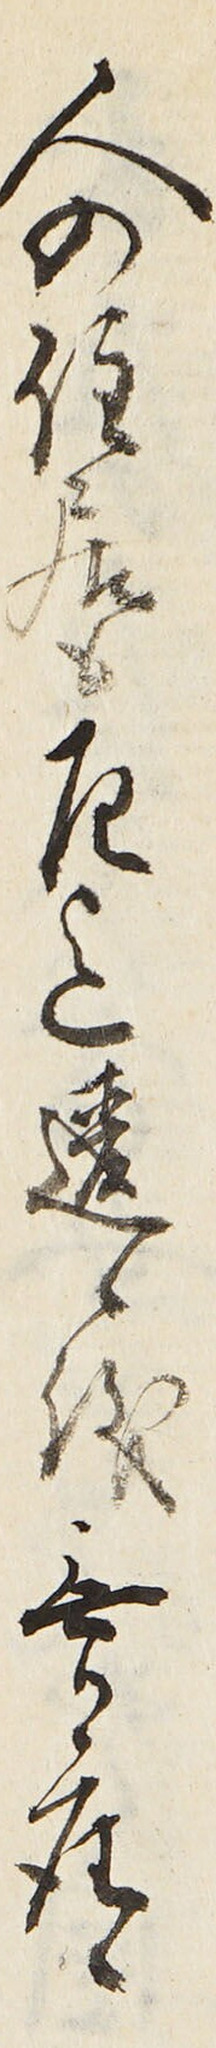人の住居も左迄違候儀無御座候
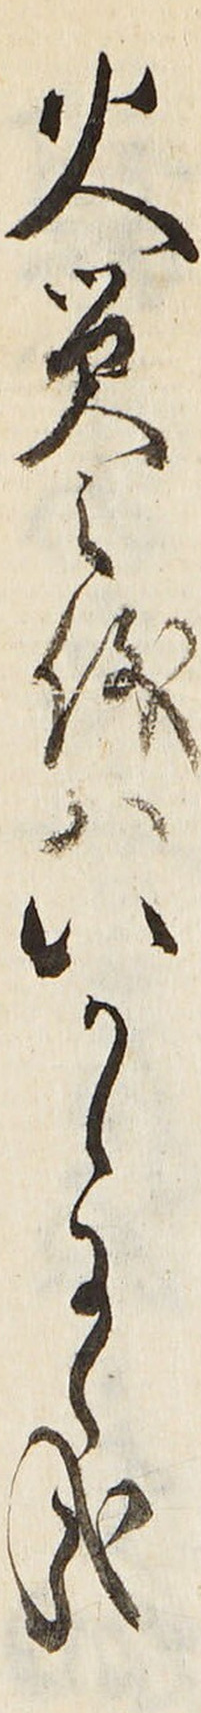火災之儀はいかゝにし哉
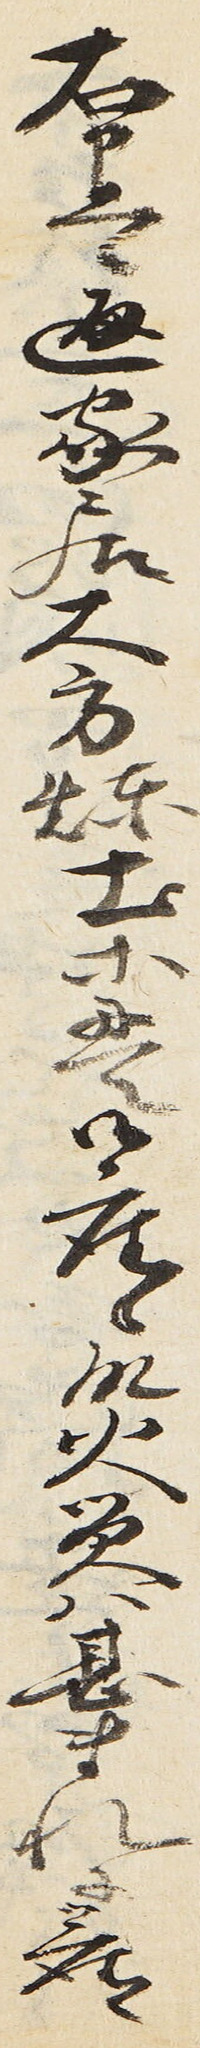右申上候通家居大方煉土等にて御座候故火災は甚まれに御座候
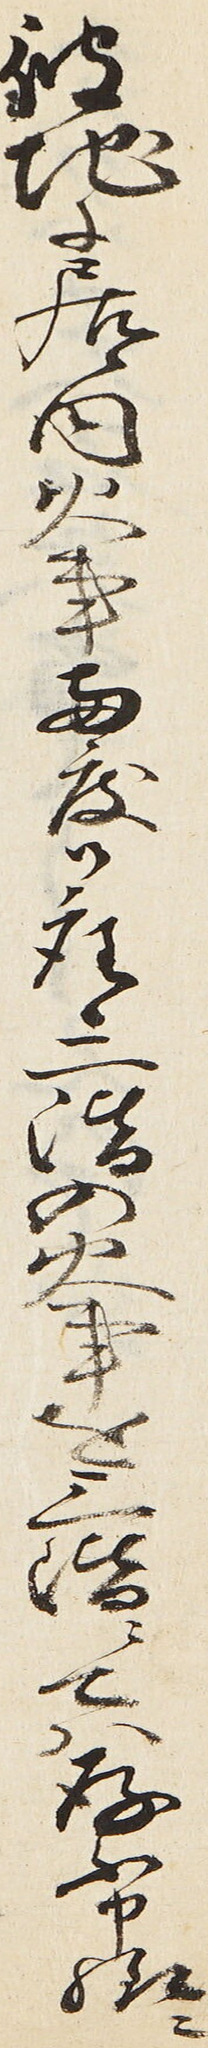彼地に居候内火事両度御座候二階の火事を三階にては存不申様に
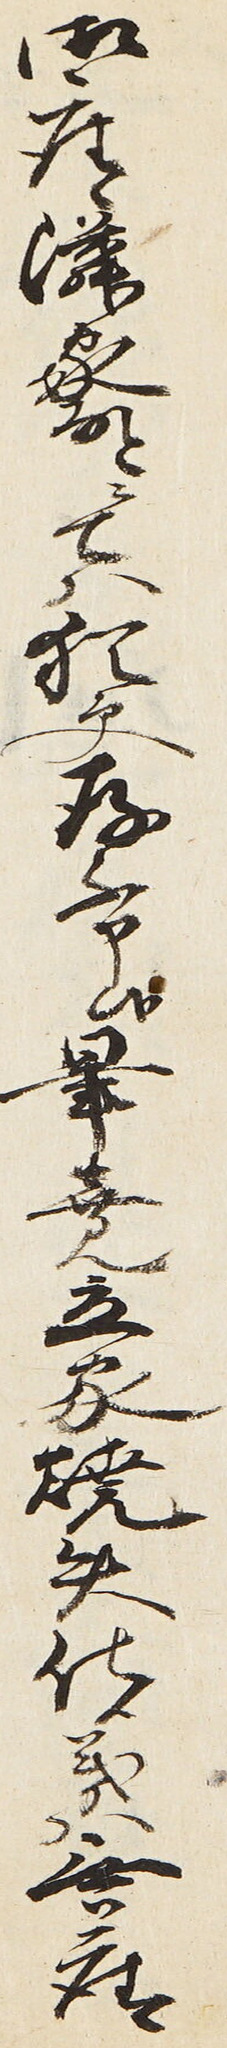御座候隣家なとにては猶更存不申候畢竟立家焼失仕候義は無御座候
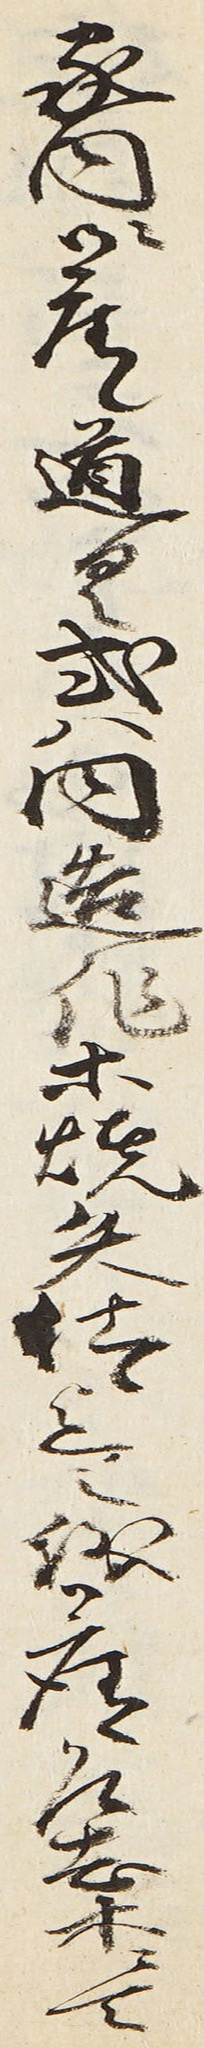家内に御座候道具或は内造作等焼失仕候迄之儀御座候乍去木にて
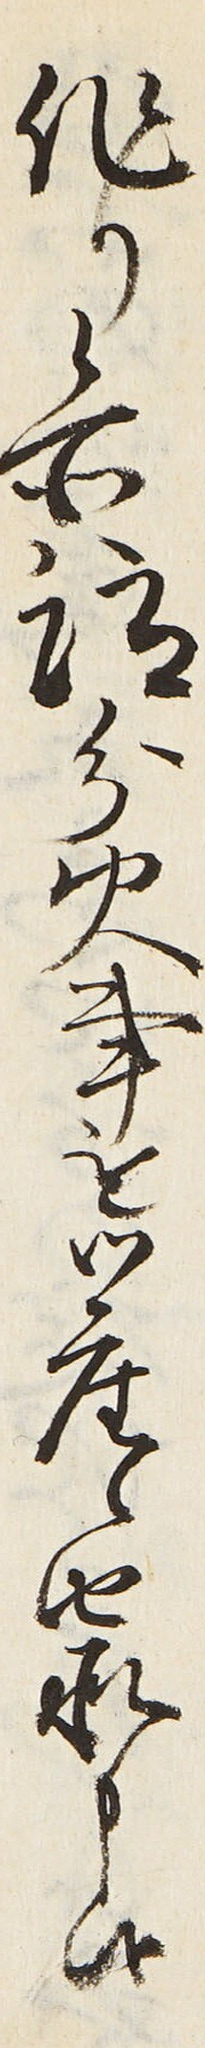作り候所は頭分火事も御座候由承申候
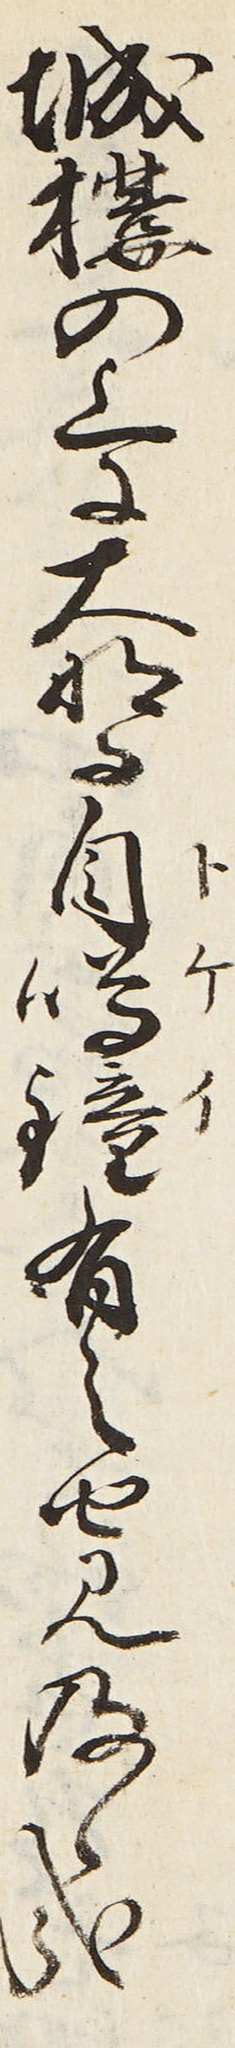城楼の上に大なる自鳴鐘有之由見及候哉
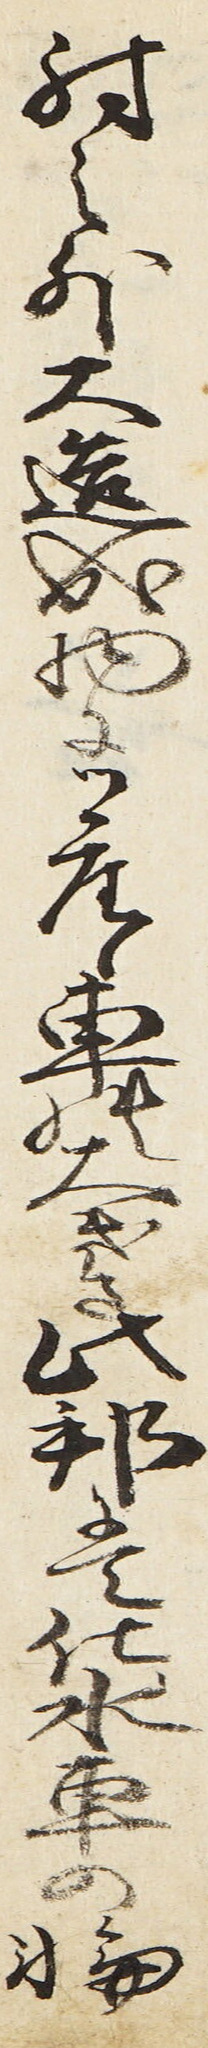殊之外大造成物に御座候車の大きさ此邦にて仕水車の輪
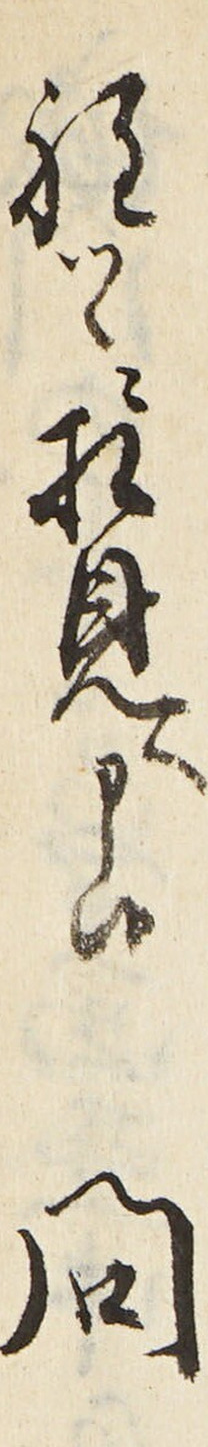程つゝに相見へ申候問

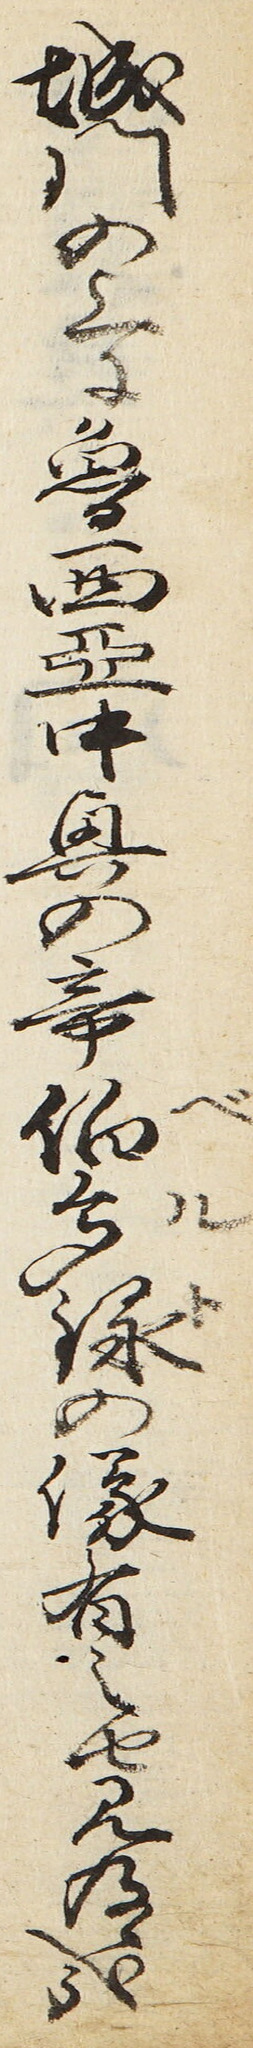城門の上に魯西亜中興の帝伯多録の像有之由見及候哉
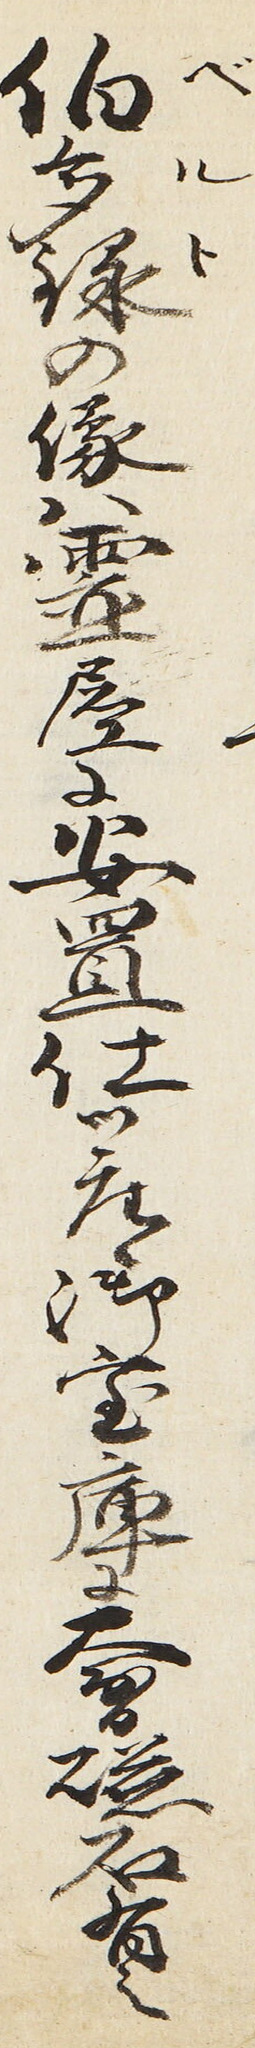伯多録の像は霊屋に安置仕御座候御宝庫に大なる磁石有之
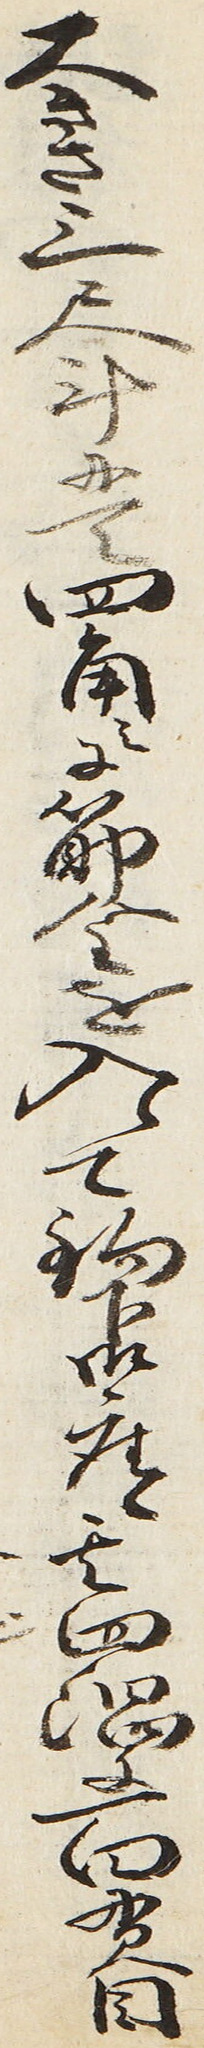大きさ三尺計にて四角みに筋金を入候て釣下御座候其四隅に百貫目
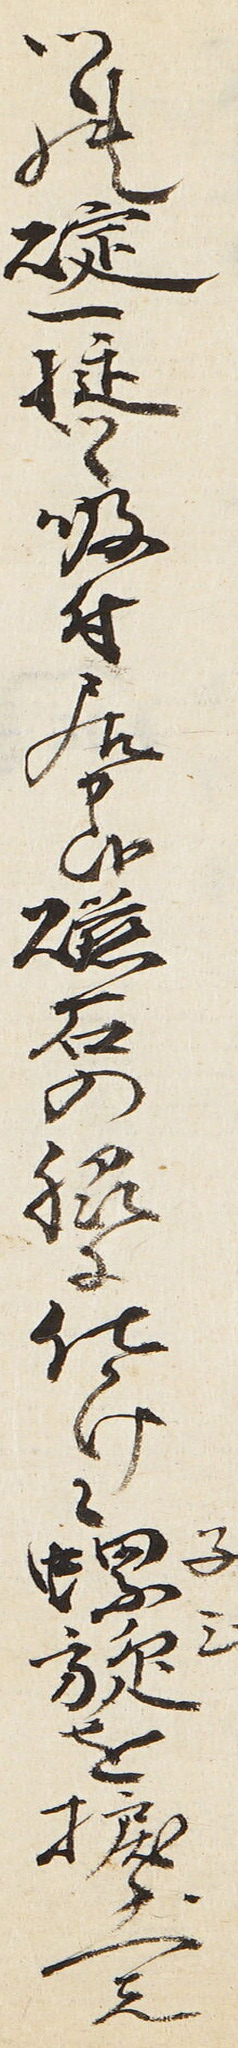つゝの碇一挺つゝ吸付居申候磁石の脇に仕かけ候螺旋を捩候へは
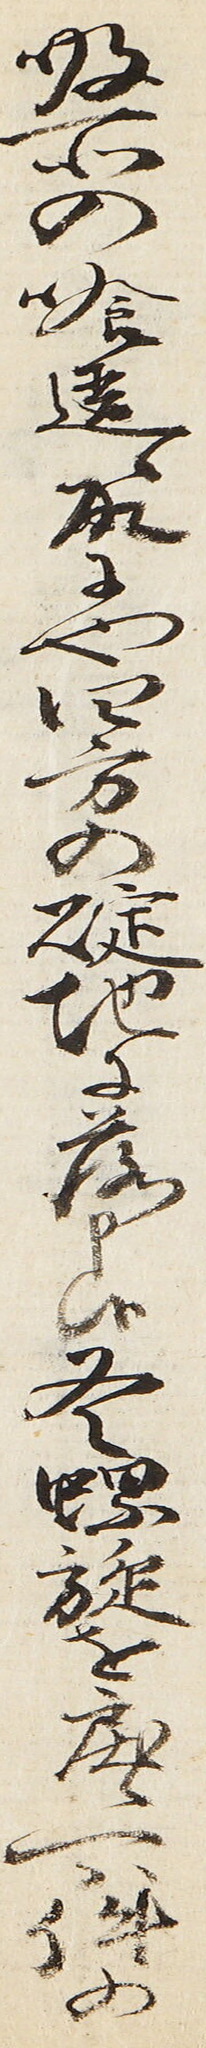吸所の喰違候故にや四方の碇地に落申候又ゝ螺旋を戻候へは件の
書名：漂民御覧之記
